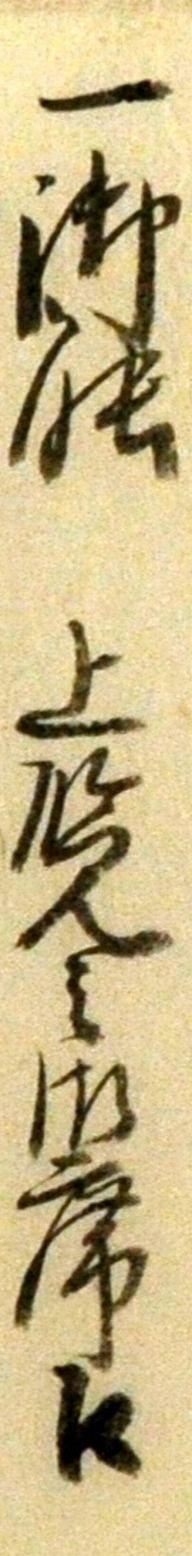一御能上覧之御席え
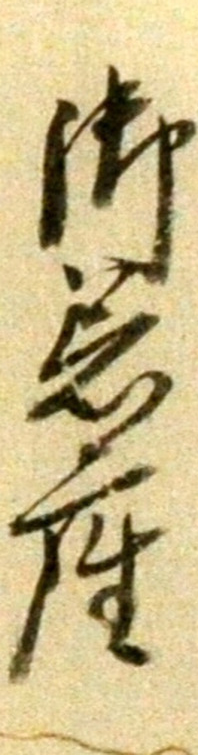御着座

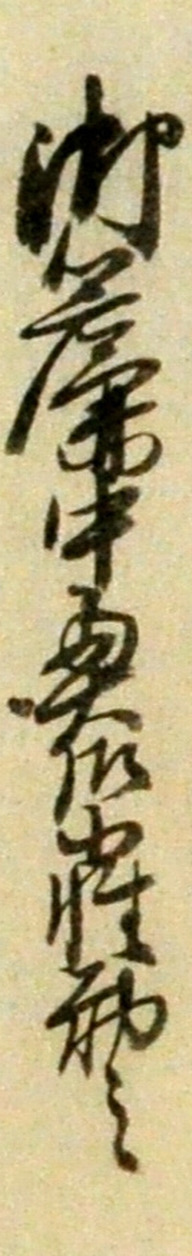御簾中奥御小性勤之
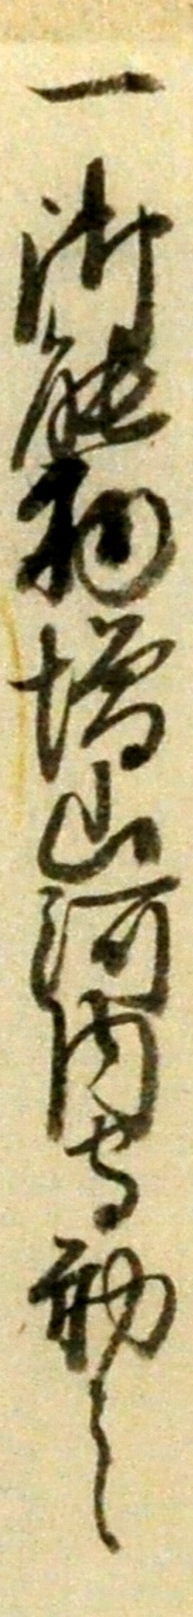一御能初増山河内守勤之
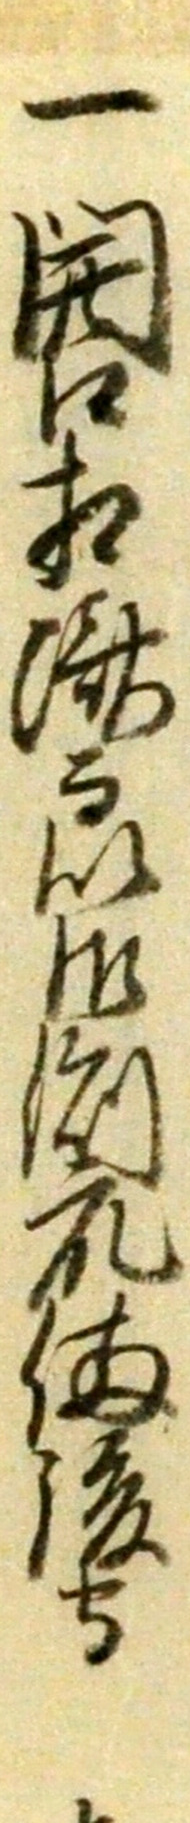一開口相済而以御側衆備後守与
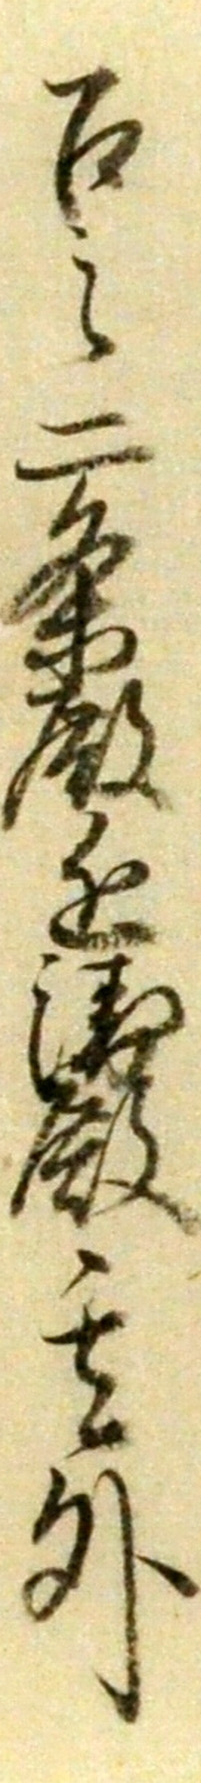召之二条殿近衛殿其外
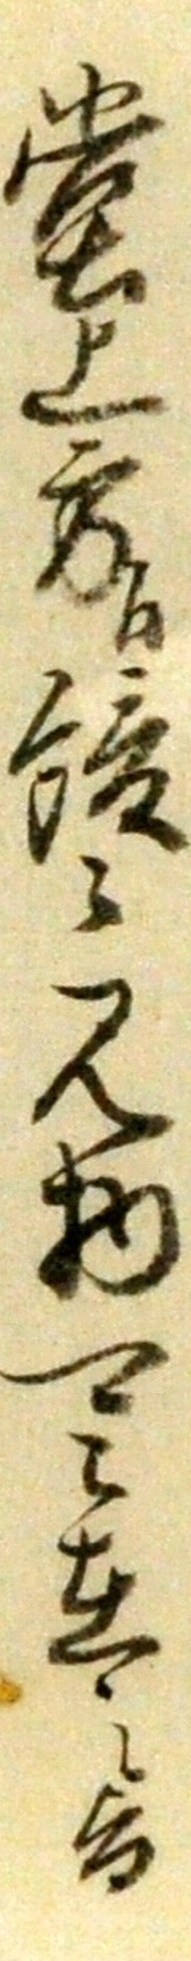堂上方え緩々見物可被在之旨
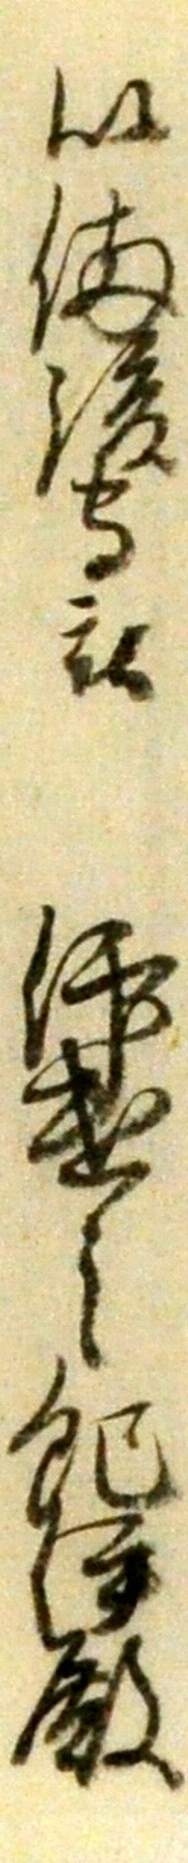以備後守被仰遣之紀伊殿
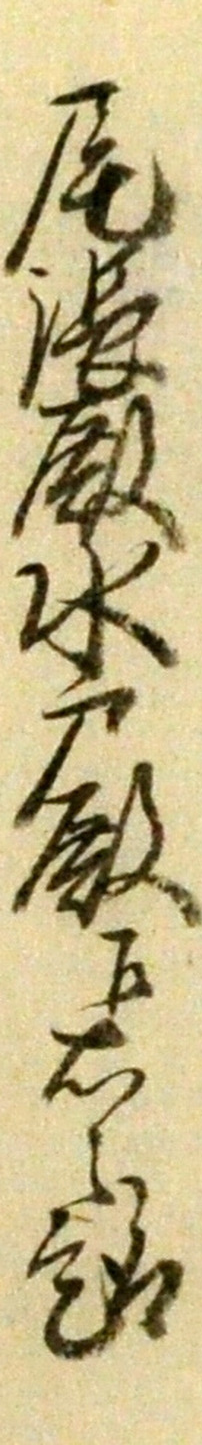尾張殿水戸殿え右之趣
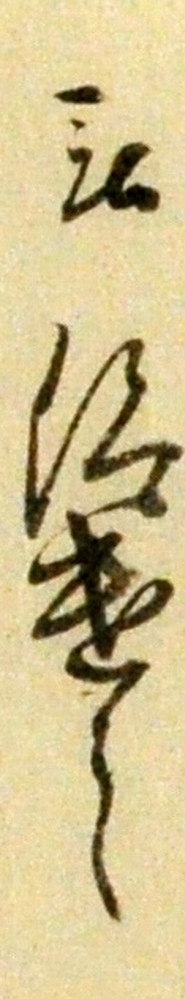被仰遣之
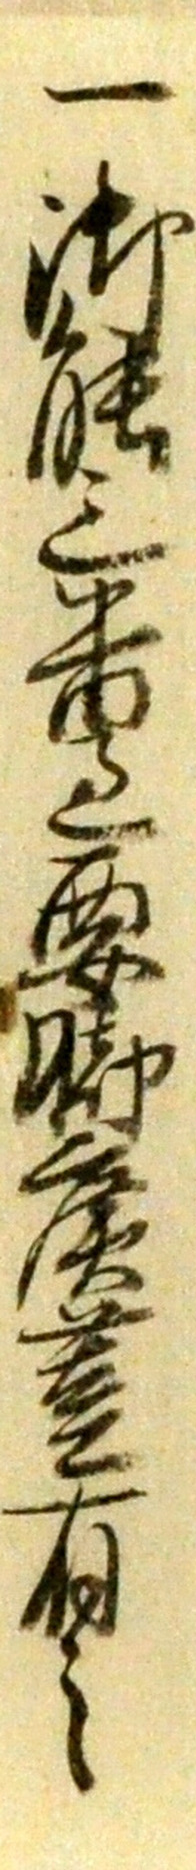一御能三番過要脚広蓋有之
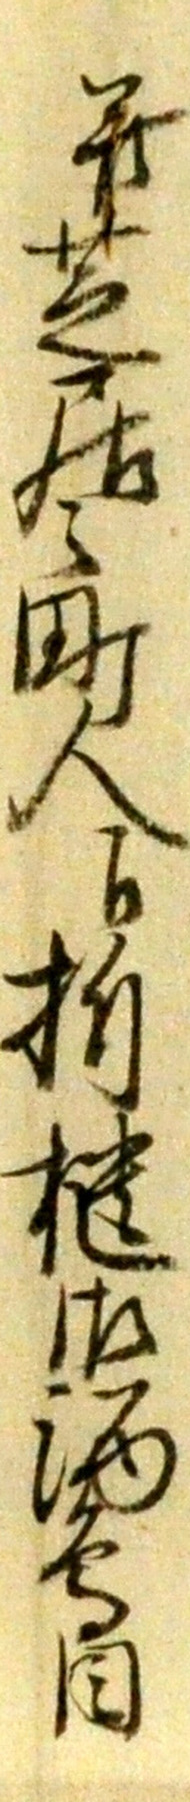并芝居之町人え折櫃御酒鳥目
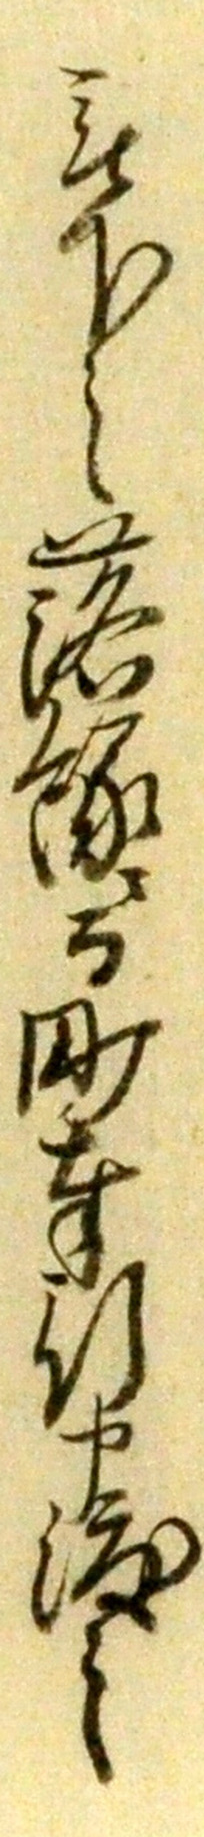被下之落縁ニ而町奉行申渡之
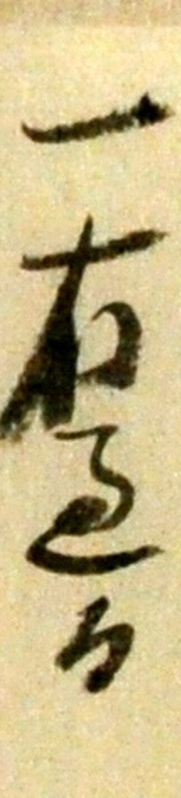一右過而
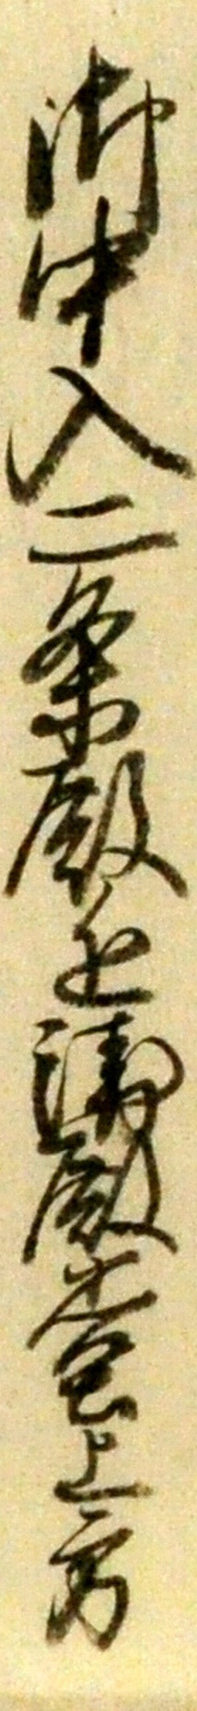御中入二条殿近衛殿堂上方
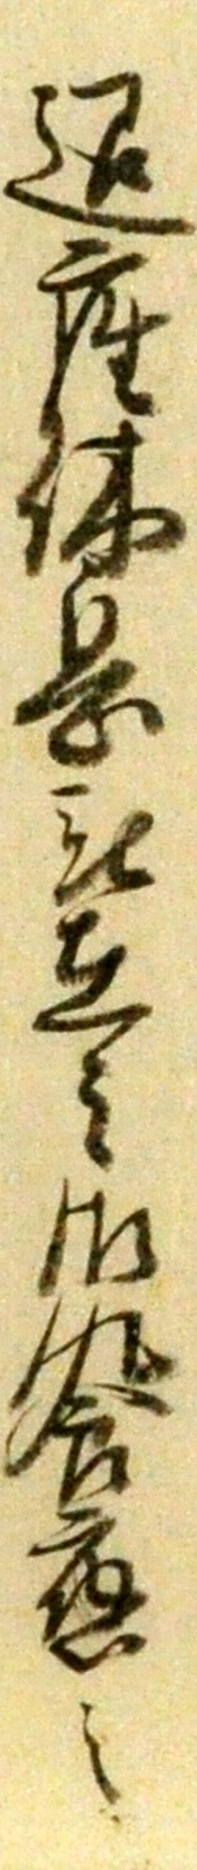退座休息被在之御饗応之
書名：御馳走御能ノ節ノ留外
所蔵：伊那市立高遠町図書館・合同会社AMANE
